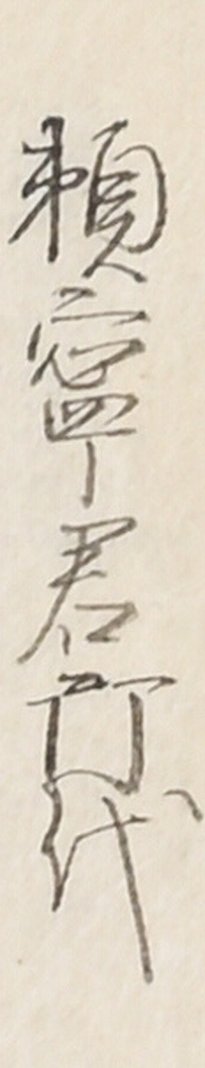頼寧君御代
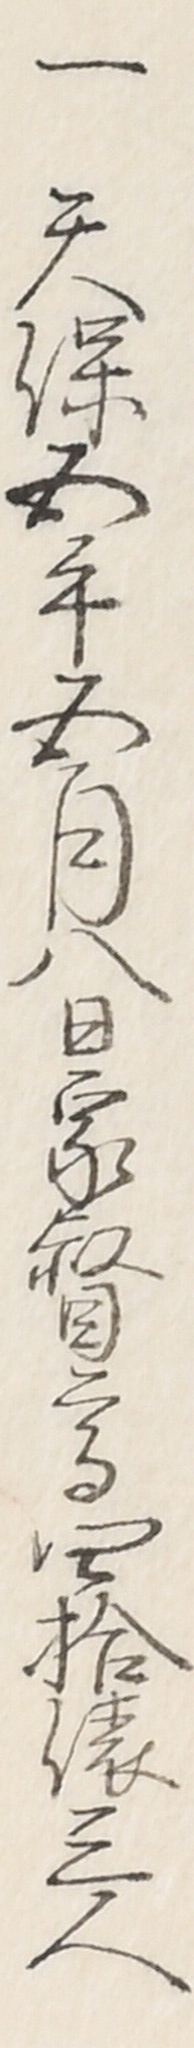一天保五午五月八日家督高四拾俵三人
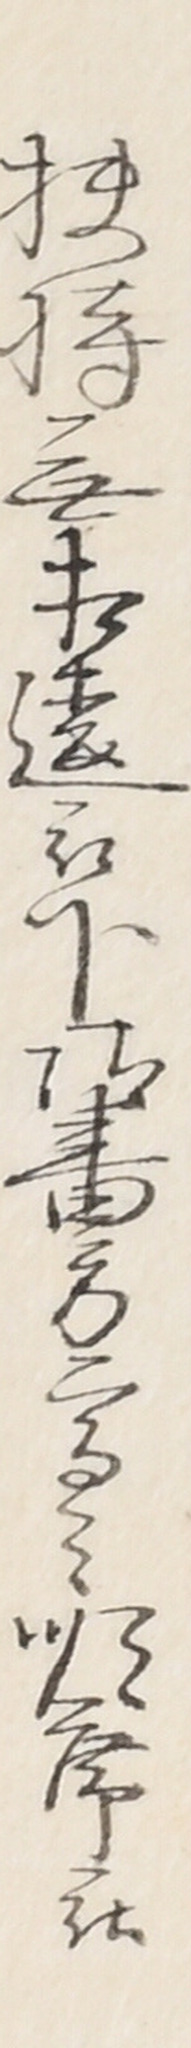扶持無相違被下御番方高之順席被
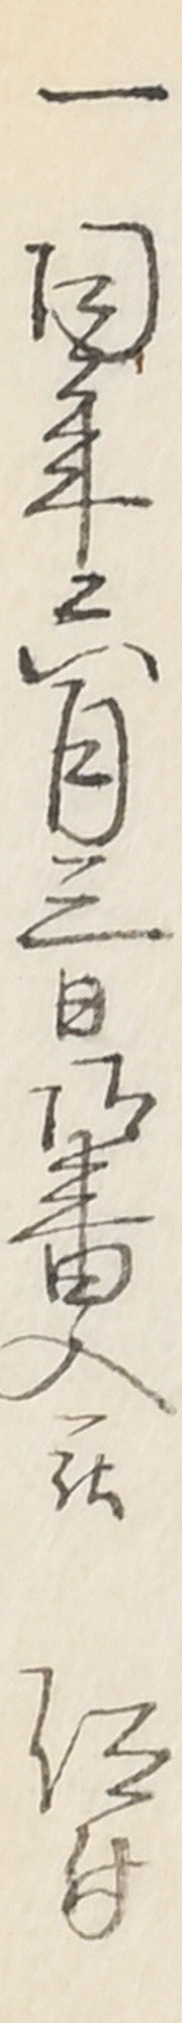一同年六月三日御番入被仰付
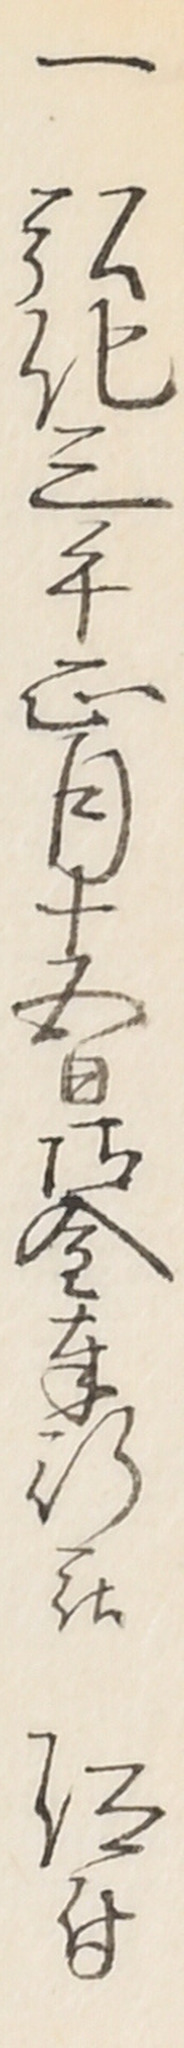一弘化三午正月十五日御金奉行被仰付
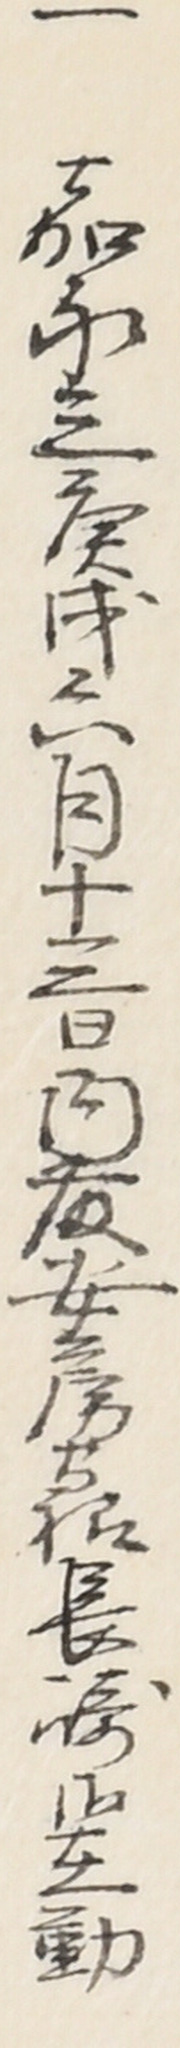一嘉永三庚戌六月十三日内藤安房守様長崎御在勤
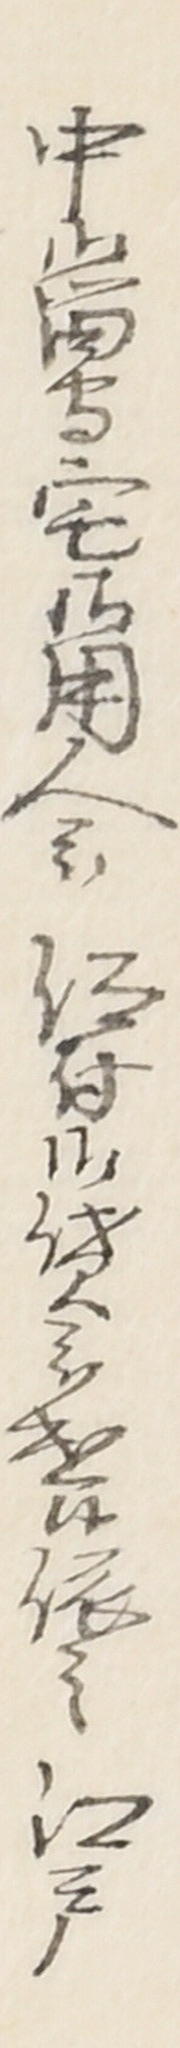中御留守宅御用人被仰付御貸被遣候依之江戸
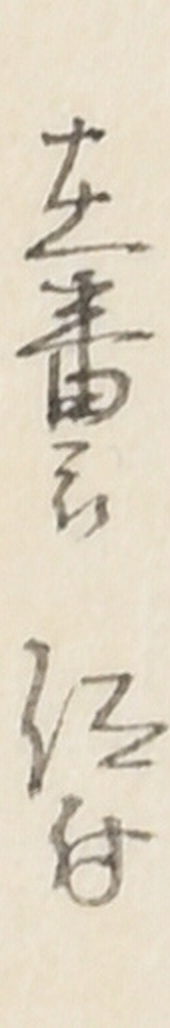在番被仰付
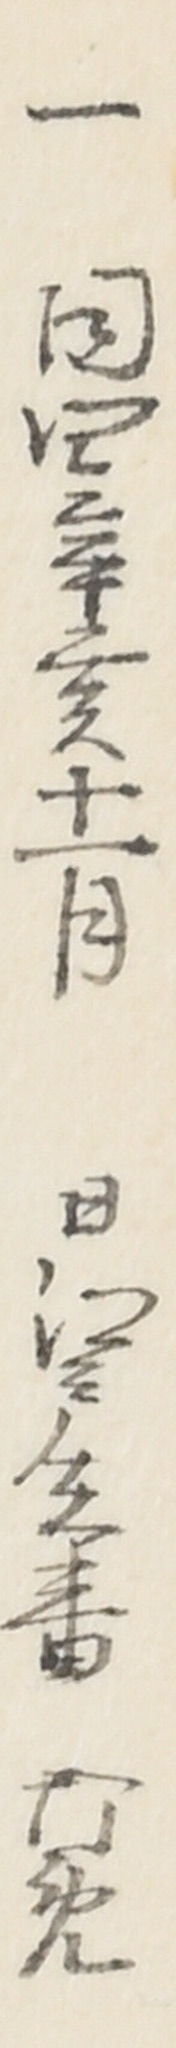一同四辛亥十一月日江戸在番御免
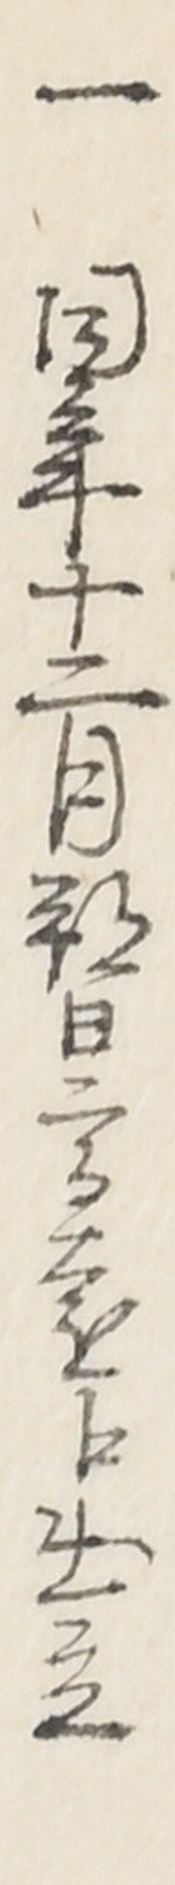一同年十二月朔日高遠江出立
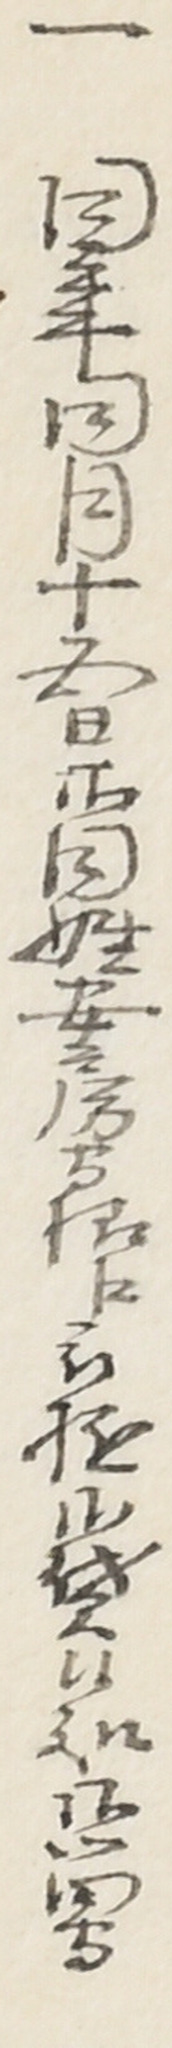一同年同月十五日御同姓安房守様江被遊御貸候処御留守
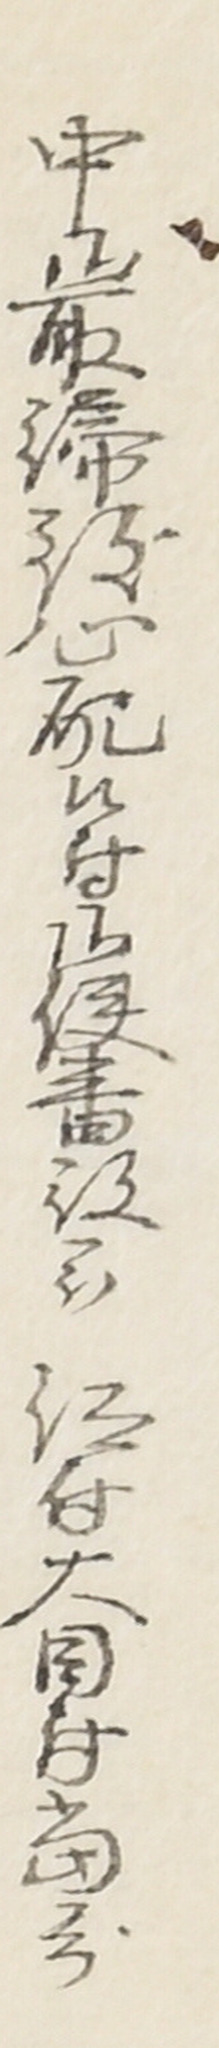中御取締致心配候付御使番役被仰付大目付当分
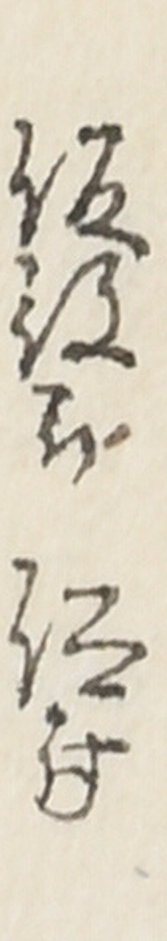仮役被仰付
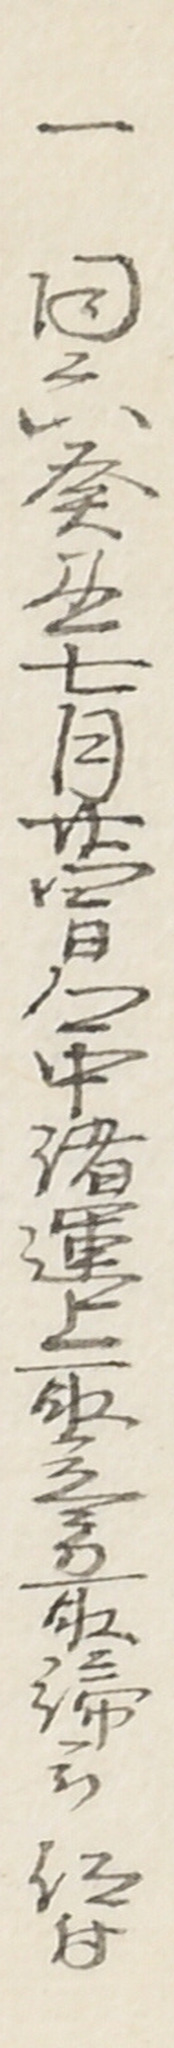一同六癸丑七月廿四日道中諸運上取立方取締被仰付
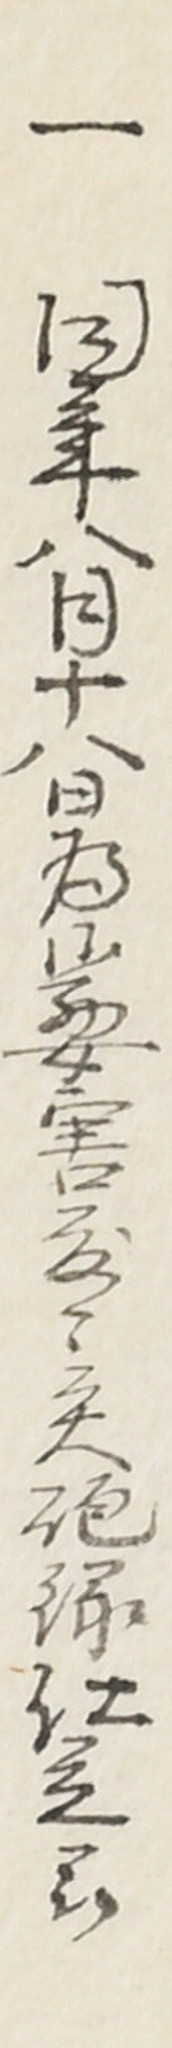一同年八月十八日為御要害度々ニ大砲録仕立被
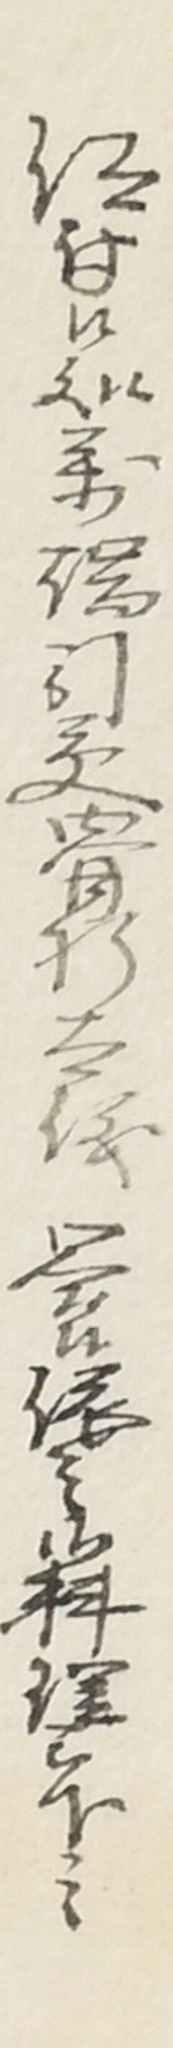仰付候処万端引受骨折太儀思召候依之御料理被下之
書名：給人諸士勤仕録（七）
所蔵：伊那市立高遠町図書館・合同会社AMANE
